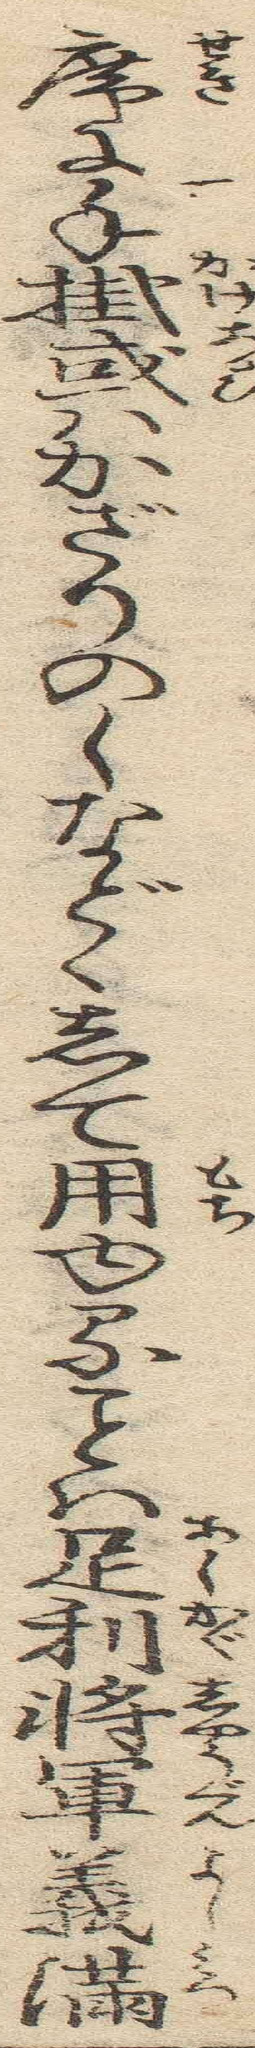席に手掛或はかざりのしなどゝして用ゆることは足利将軍義満
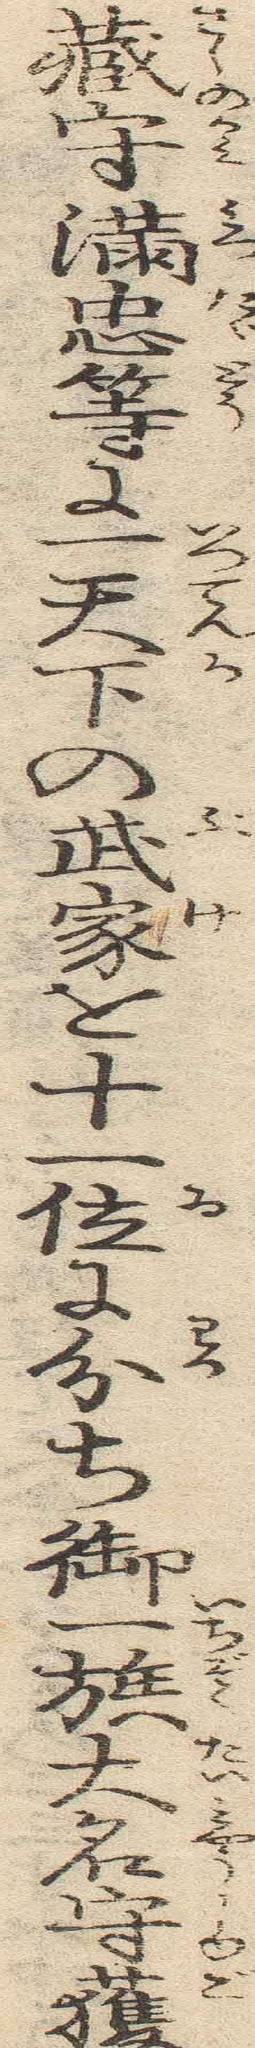蔵守満忠等に一天下の武家を十一位に分ち御一族大名守護
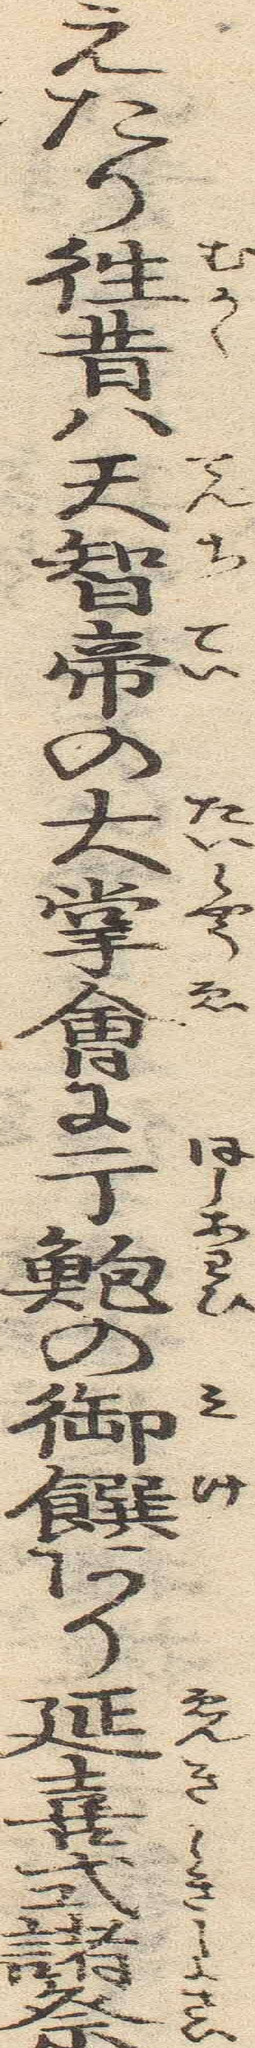えたり往昔は天智帝の大掌会に干鮑の御饌あり延喜式諸祭
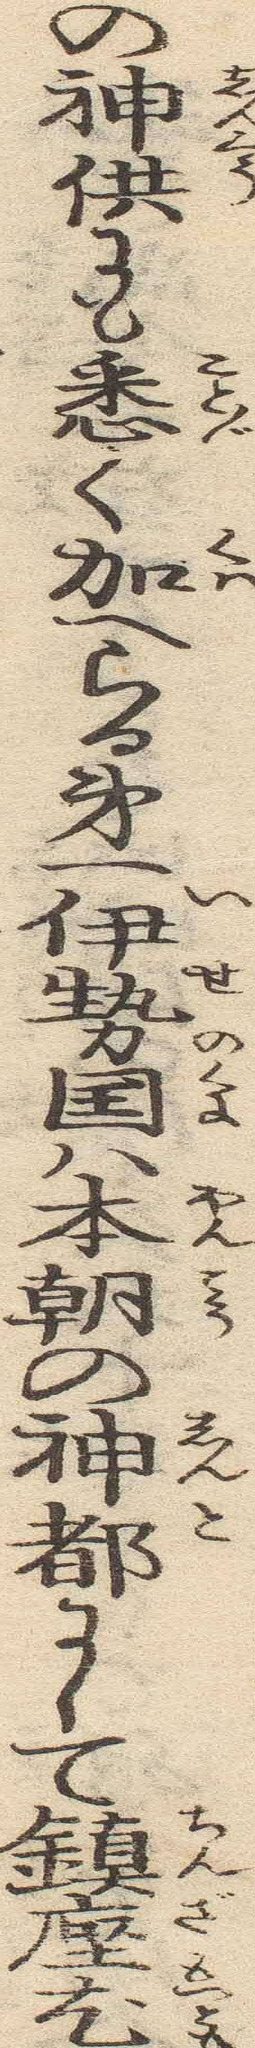の神供にも悉く加へらる第一伊勢国は本朝の神都にして鎮座尤
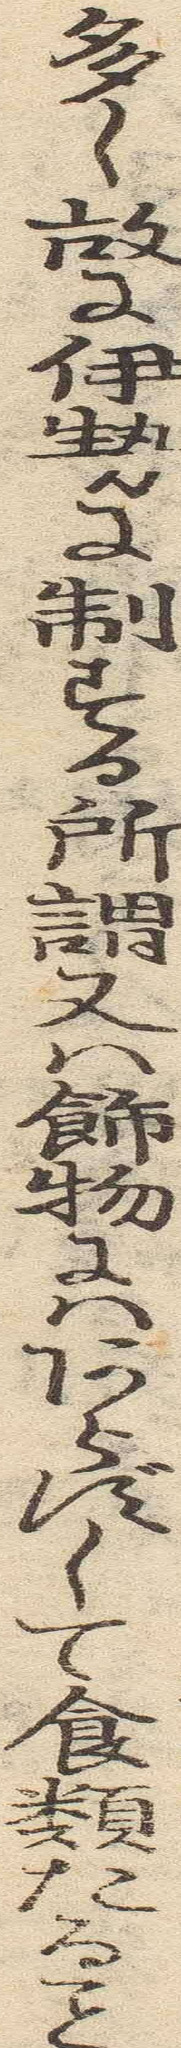多し故に伊勢に制する所謂又は飾物にはあらずして食類たること
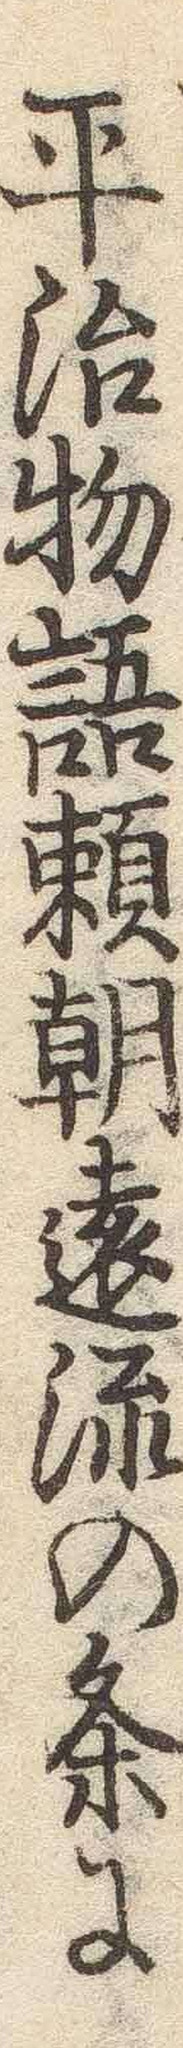平治物語頼朝遠流の条に
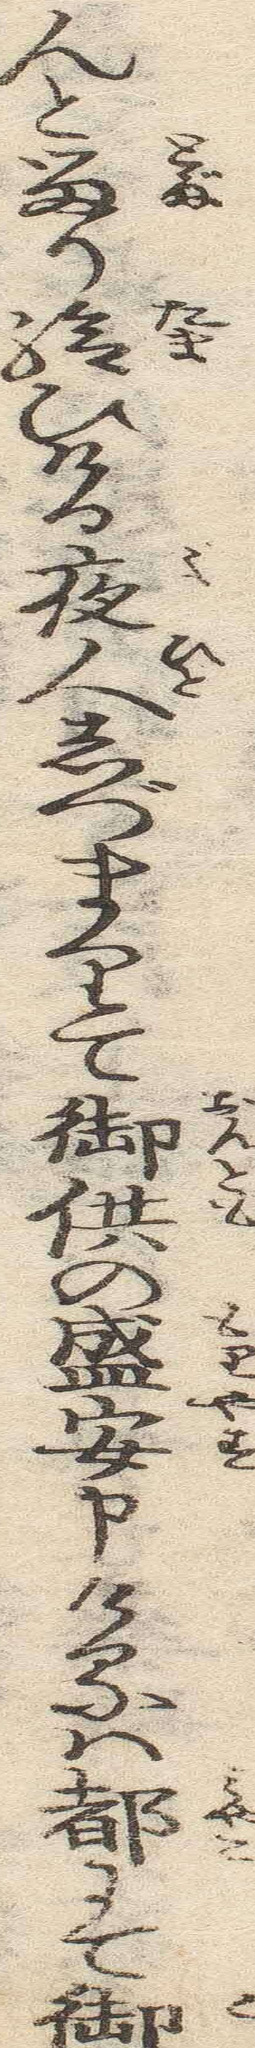んと留り給ひける夜人しづまりて御供の盛安申けるは都にて御
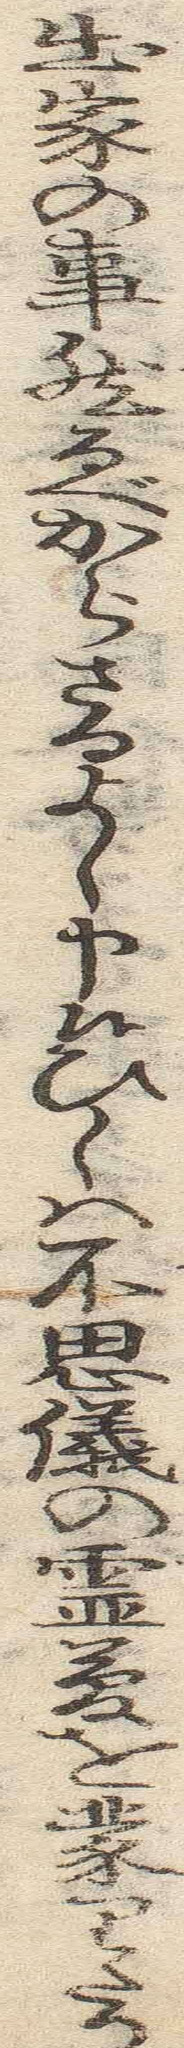出家の事然るべからさるよし申候ひしは不思儀の霊夢を蒙りたり
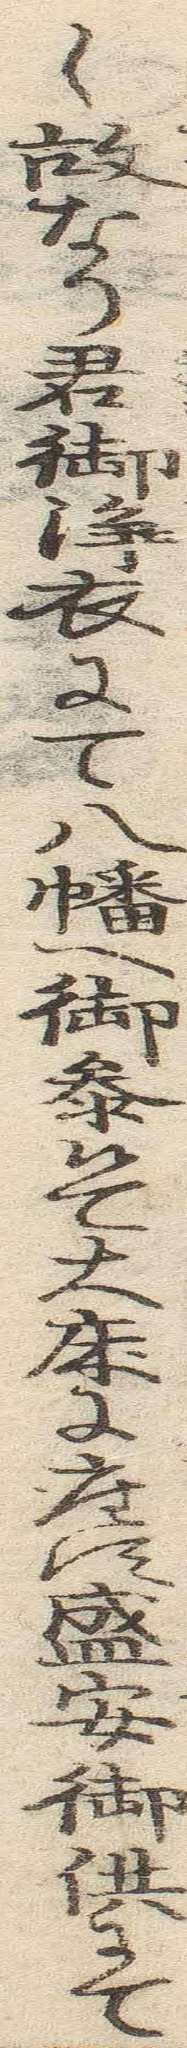し故なり君御浄衣にて八幡へ御参候て大床に座す盛安御供にて
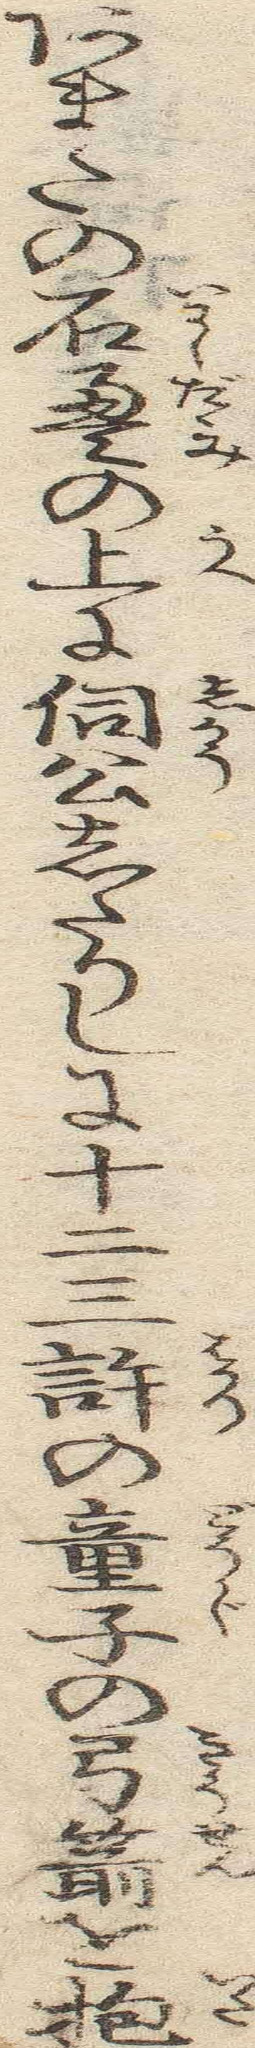あまたの石畳の上に伺公したりしに十二三許の童子の弓箭を抱
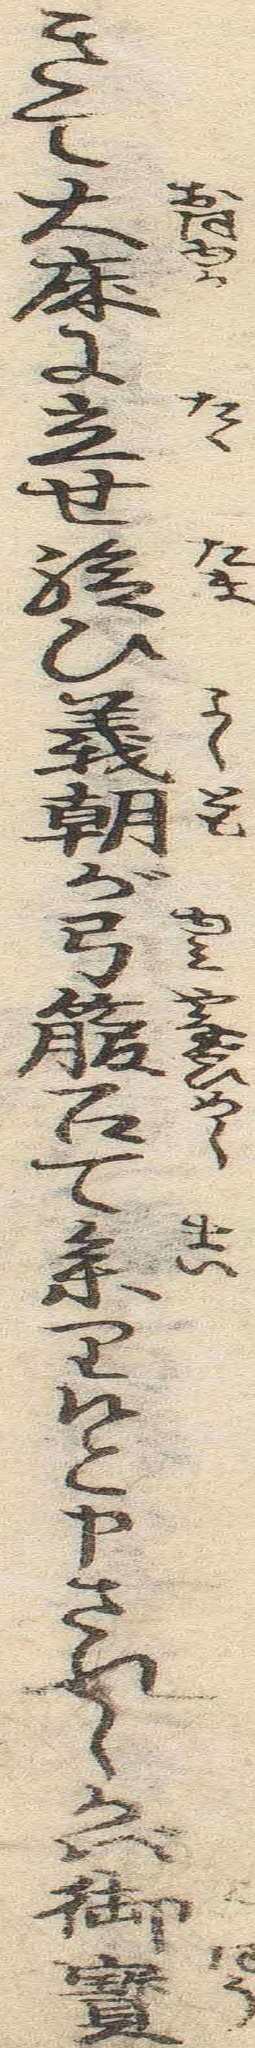きて大床に立せ給ひ義朝が弓箙召て参り候と申されしかば御宝
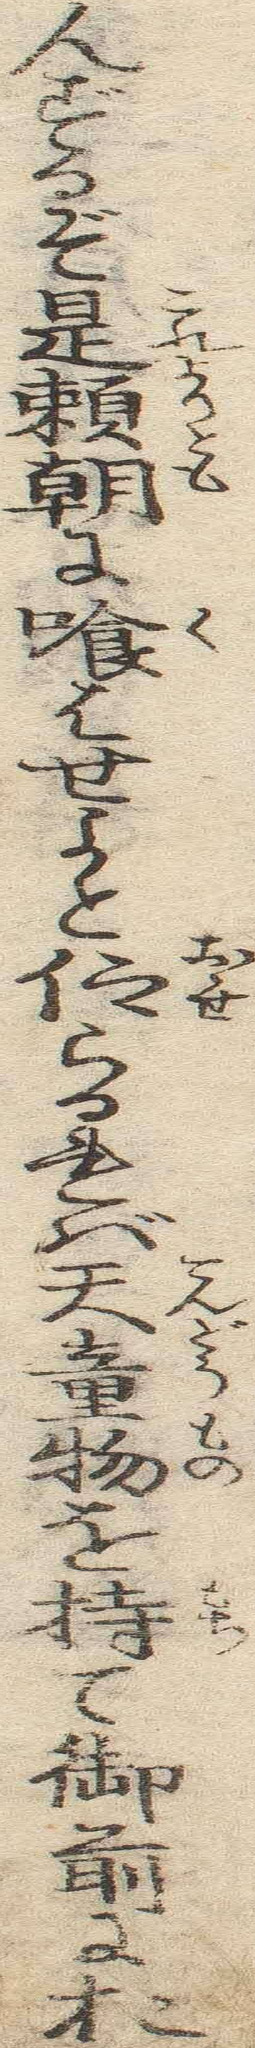んずるぞ是頼朝に喰はせよと仰らるれば天童物を持て御前にお
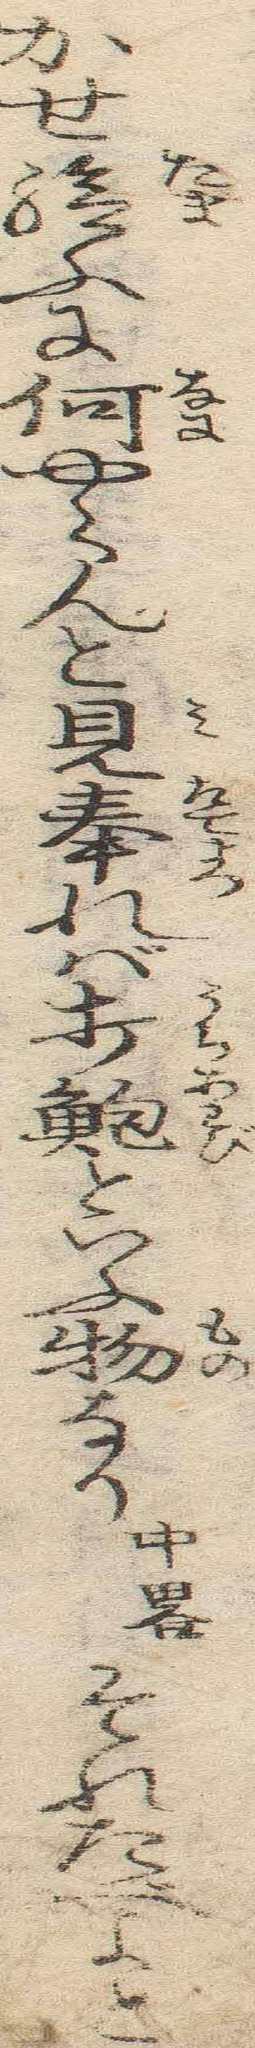かせ給ふに何やらんと見奉れば打鮑といふ物なり中略それたべよと
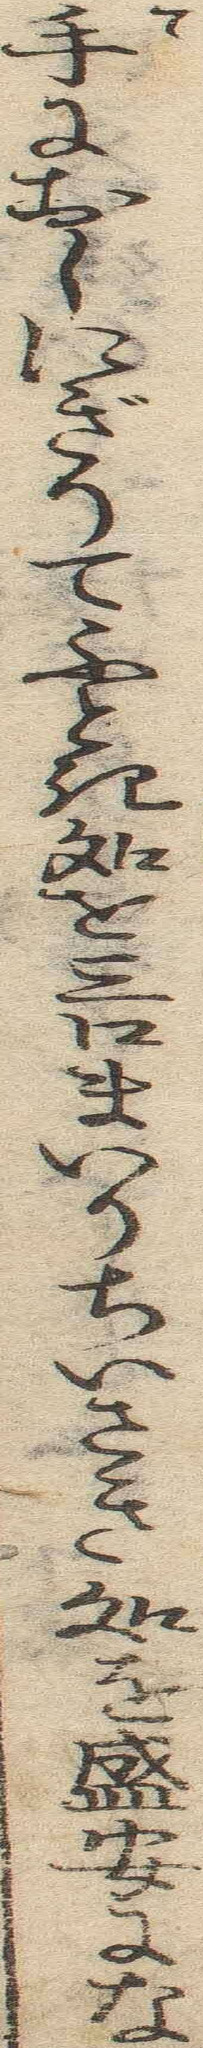手におしにぎりてふとき処を三口まいりちいさき処を盛安にな

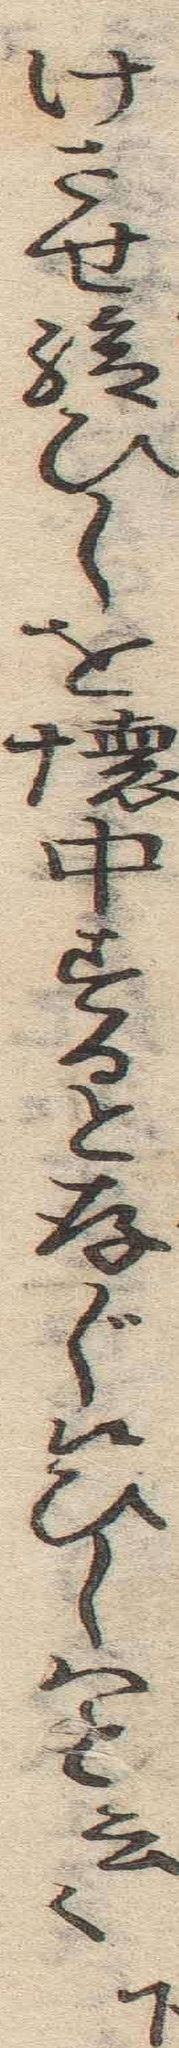けさせ給ひしを懐中すると存じ候ひしはと云々下略
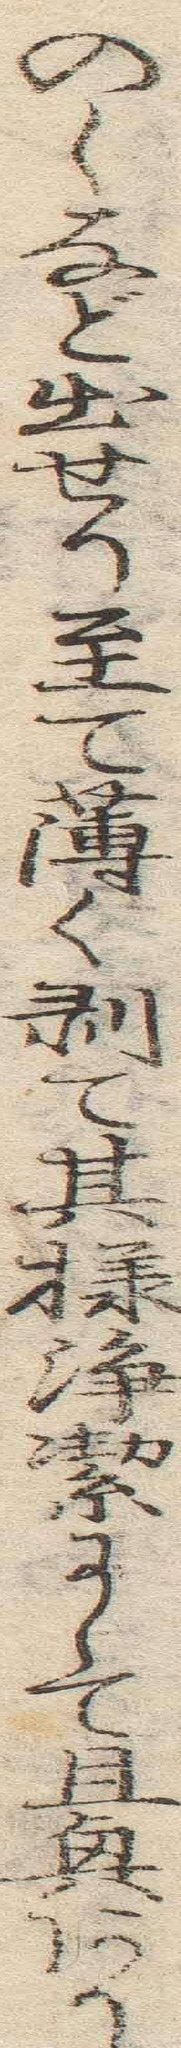のしなど出せり至て薄く剥て其様浄潔にして且興あり
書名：日本山海名産図会
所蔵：東京学芸大学附属図書館 国文学研究資料館
